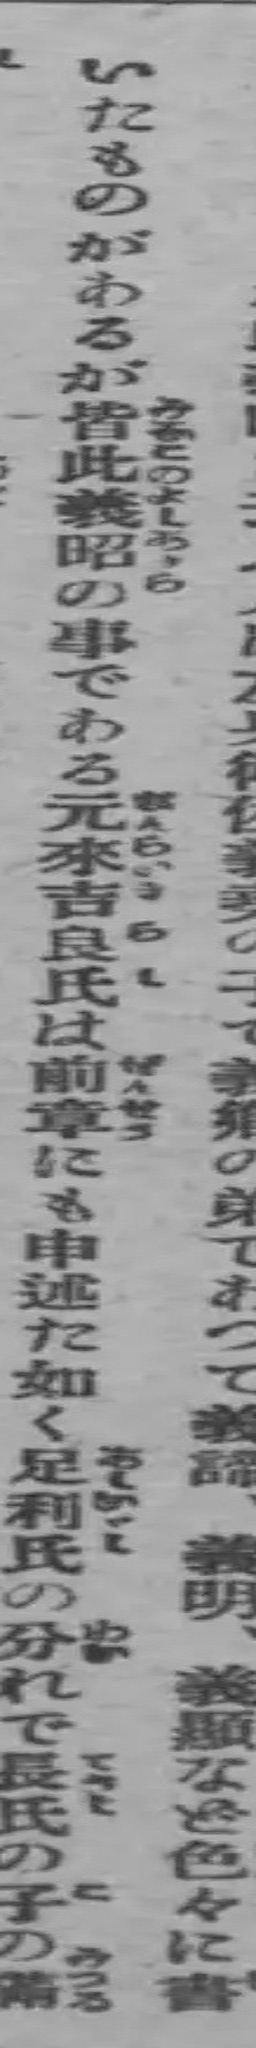いたものがあるが皆此義昭の事である元来吉良氏は前章にも申述た如く足利氏の分れで長氏の子の満
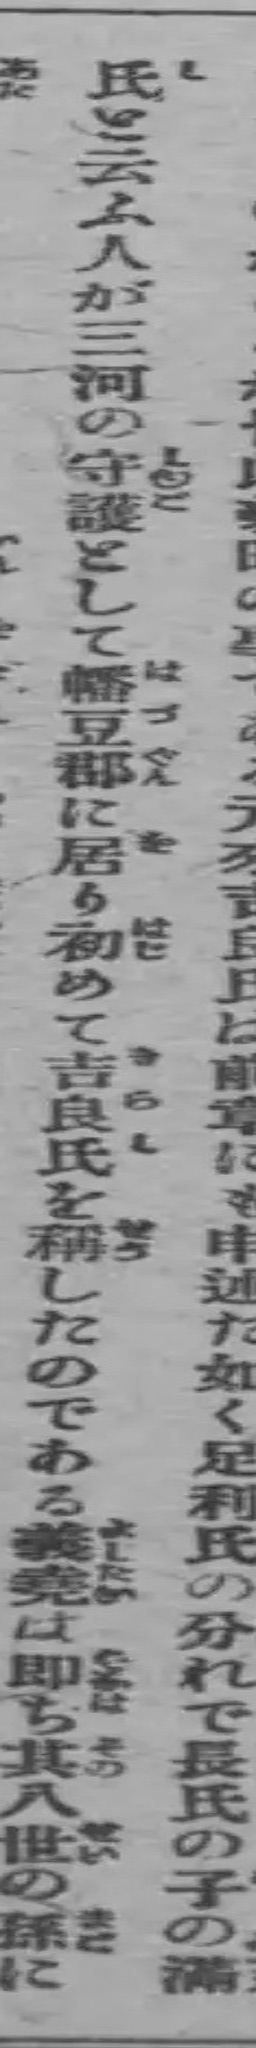氏と云ふ人が三河の守護として幡豆郡に居り初めて吉良氏を称したのである義尭は即ち其八世の孫に
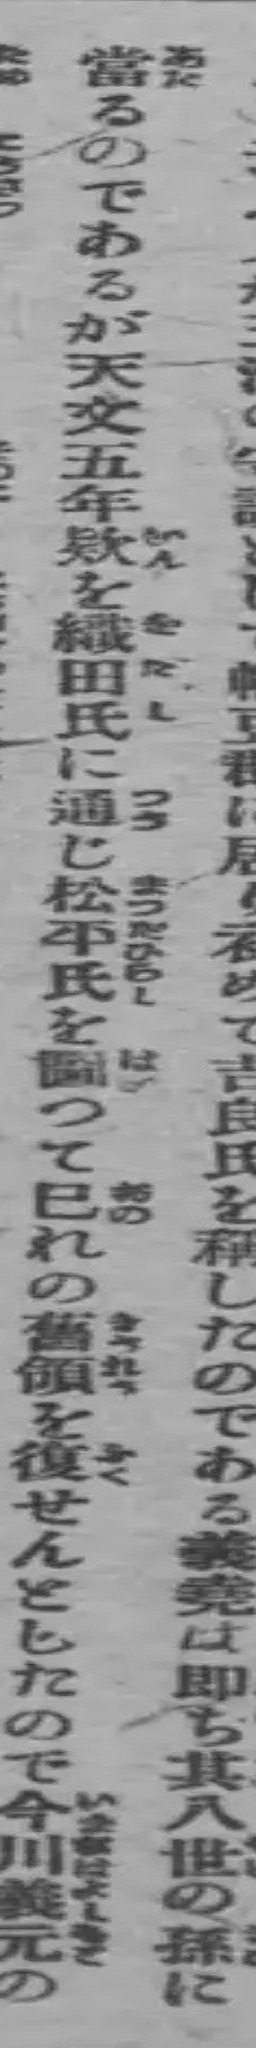当るのであるが天文五年欵を織田氏に通じ松平氏を図つて巳れの旧領を復せんとしたので今川義元の
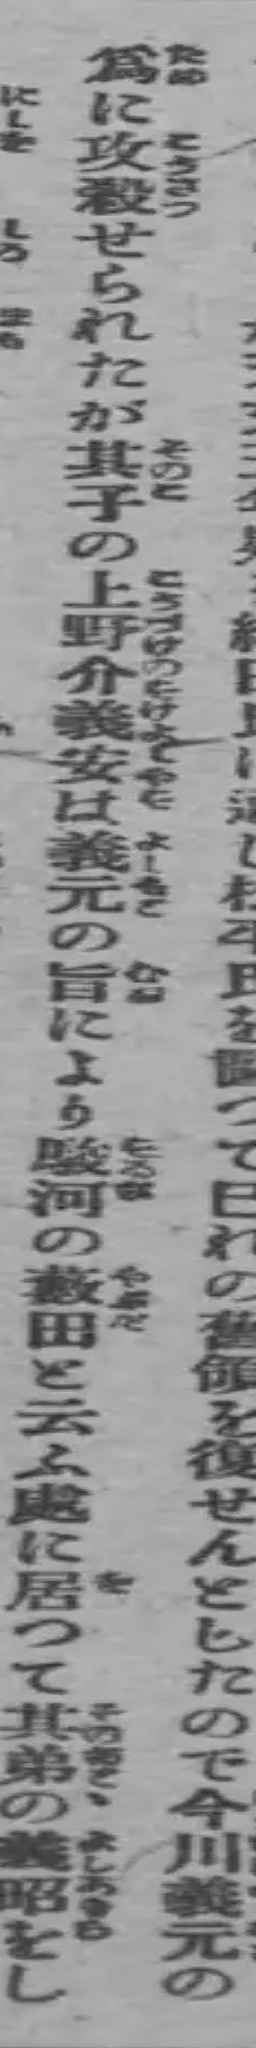為に攻殺せられたが其子の上野介義安は義元の旨により駿河の薮田と云ふ処に居つて其弟の義昭をし
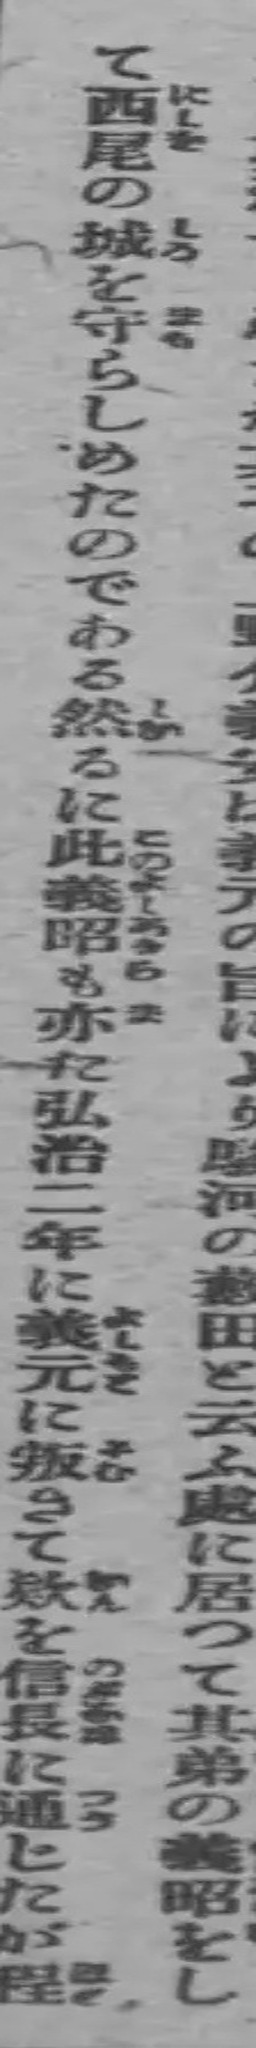て西尾の城を守らしめたのである然るに此義昭も亦た弘治二年に義元に叛きて欵を信長に通じたが程
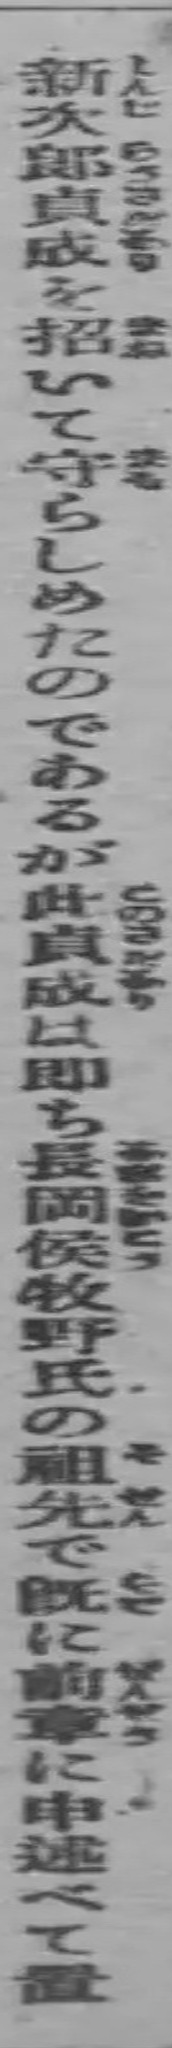新次郎貞成を招いて守らしめたのであるが此貞成は即ち長岡侯牧野氏の祖先で既に前章に申述べて置
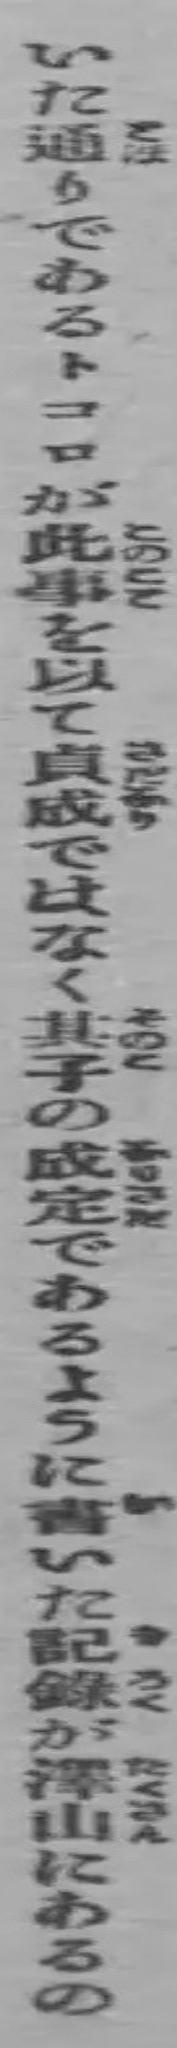いた通りであるトコロが此事を以て貞成ではなく其子の成定であるように書いた記録が沢山にあるの
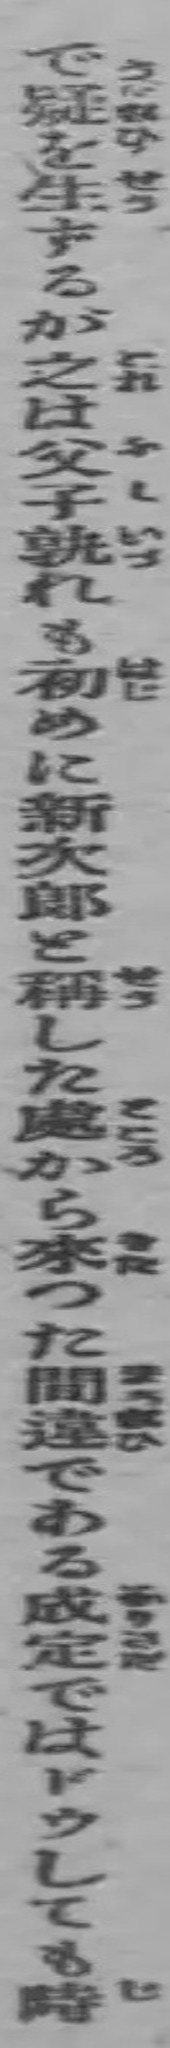で疑を生ずるが之は父子孰れも初めに新次郎と称した処から来つた間違である成定ではドウしても時
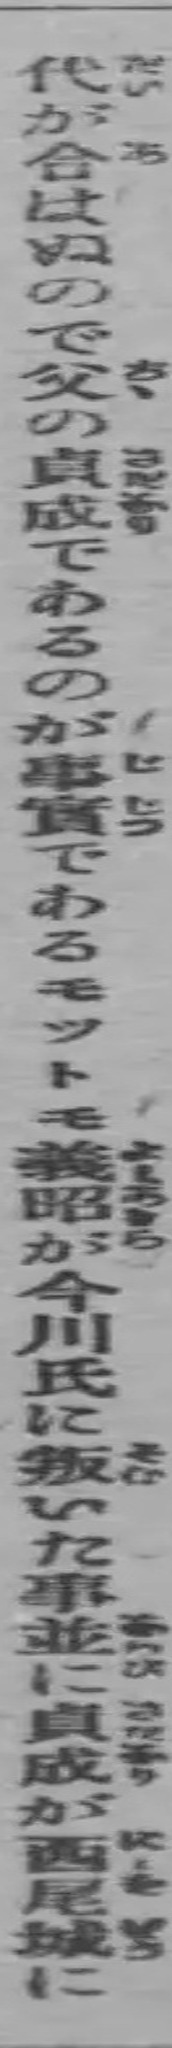代が合はぬので父の貞成であるのが事実であるモツトモ義昭が今川氏に叛いた事並に貞成が西尾城に
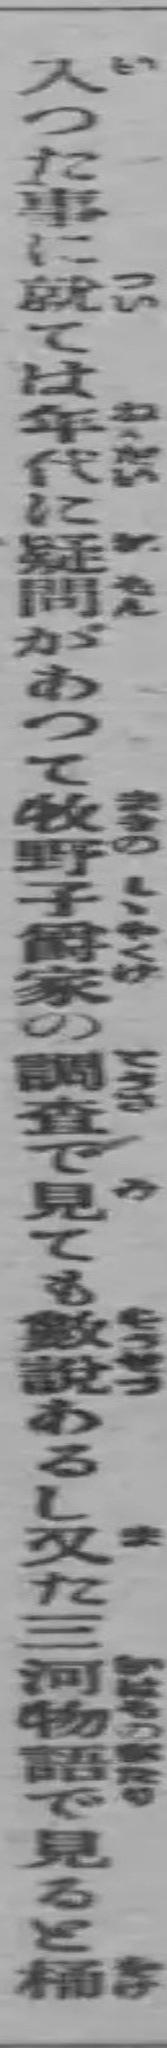入つた事に就ては年代に疑問があつて牧野子爵家の調査で見ても数説あるし又た三河物語で見ると桶
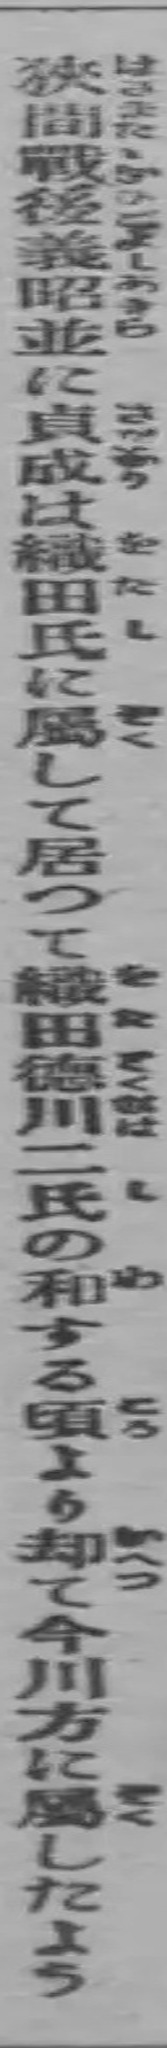狭間戦後義昭並に貞成は織田氏に属して居つて織田徳川二氏の和する頃より却て今川方に属したよう
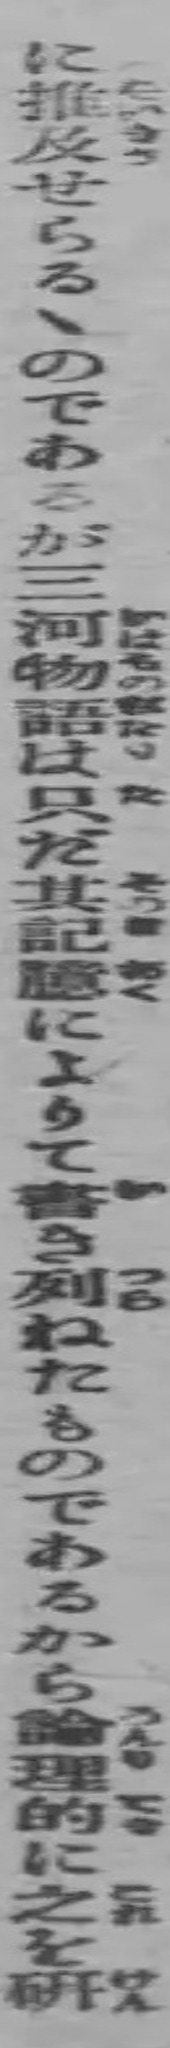に推及せらるゝのであるが三河物語は只だ其記憶によりて書き列ねたものであるから論理的に之を研
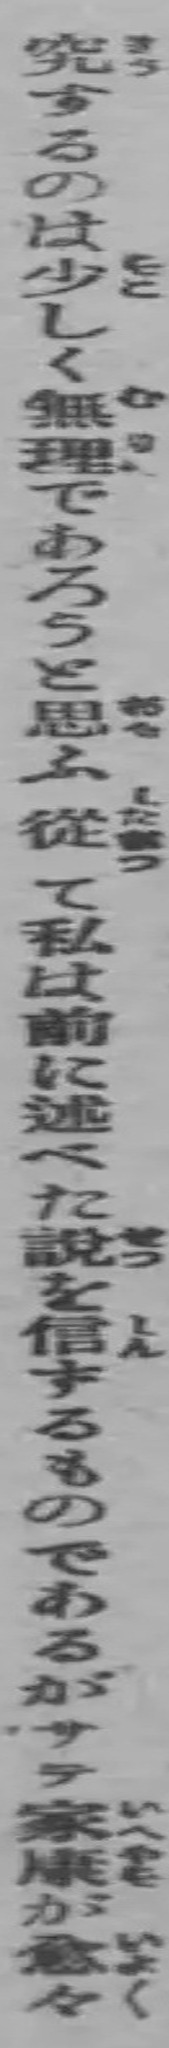究するのは少しく無理であろうと思ふ従て私は前に述べた説を信ずるものであるがサテ家康が愈々
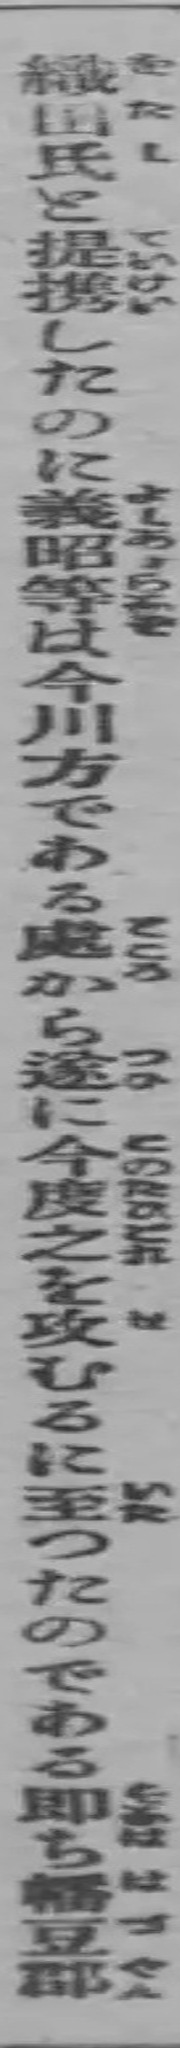織田氏と提携したのに義昭等今川方である処から遂に今度之をせ攻むるに至つたのである即ち幡豆郡
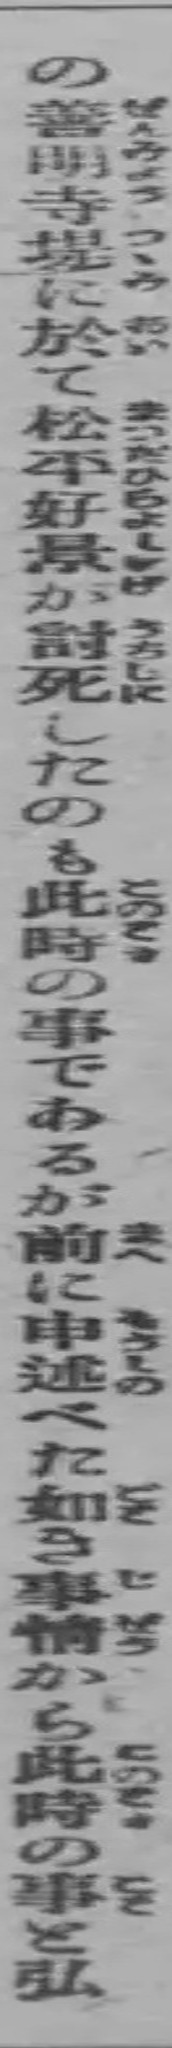の善明寺堤に於て松平好景が討死したのも此時の事であるが前に申述べた如き事情から此時の事と弘
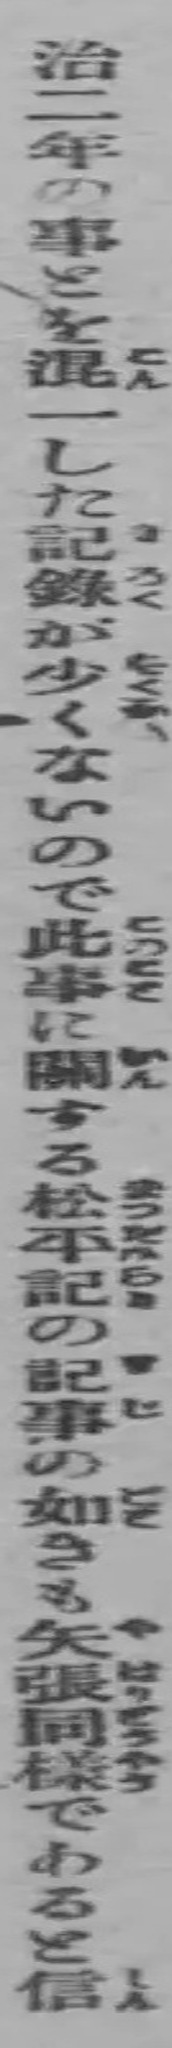治二年の事とを混一した記録が少くないので此事に関する松平記の記事の如きも矢張同様であると信
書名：豊橋市史談
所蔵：国立国会図書館 National Diet Library, JAPAN
